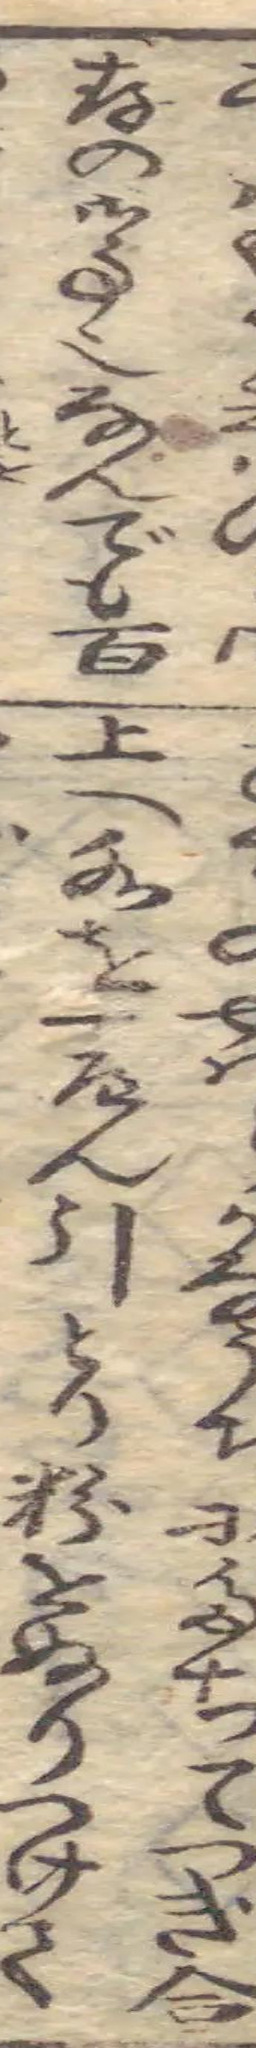存の御事也なんでも百
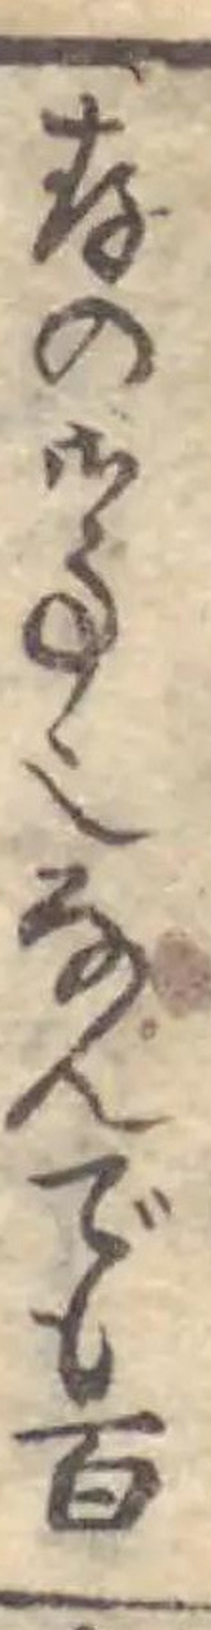存の御事也なんでも百
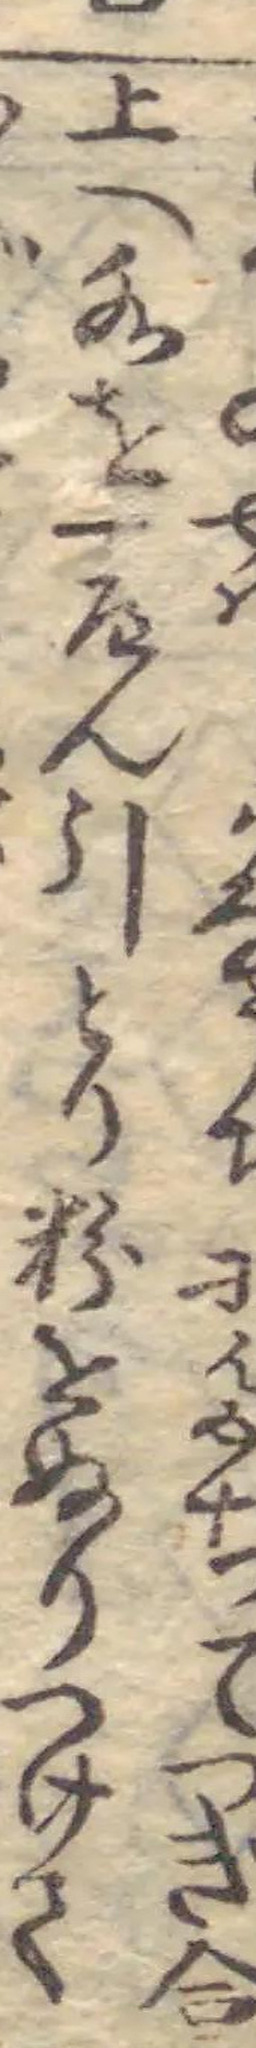上へ水を一へん引とり粉をぬりつけて
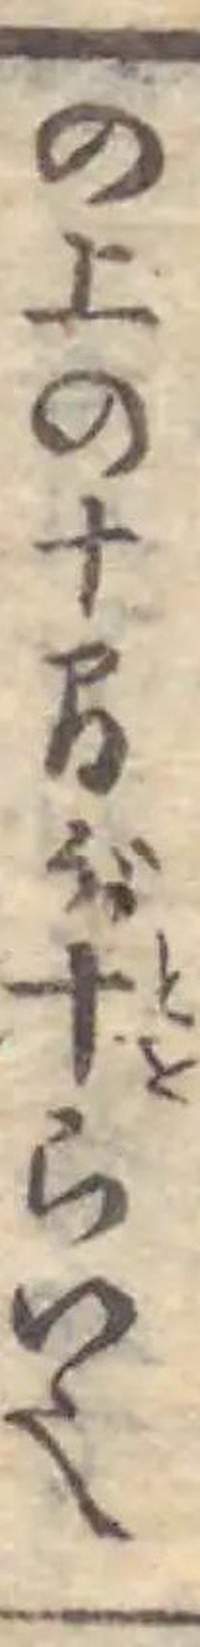の上の十間が十らい也
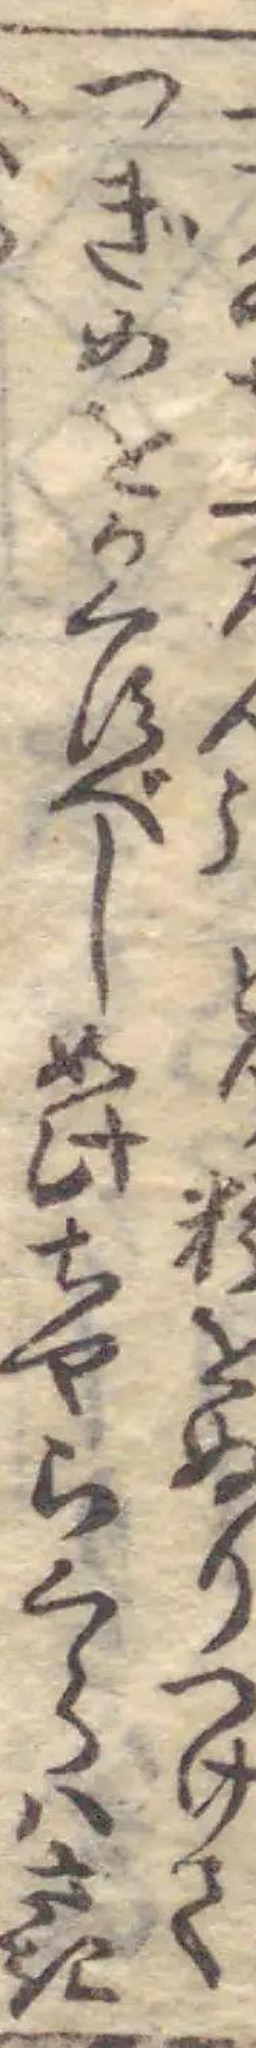つぎめをかくすべし如此ちやらくらはさき
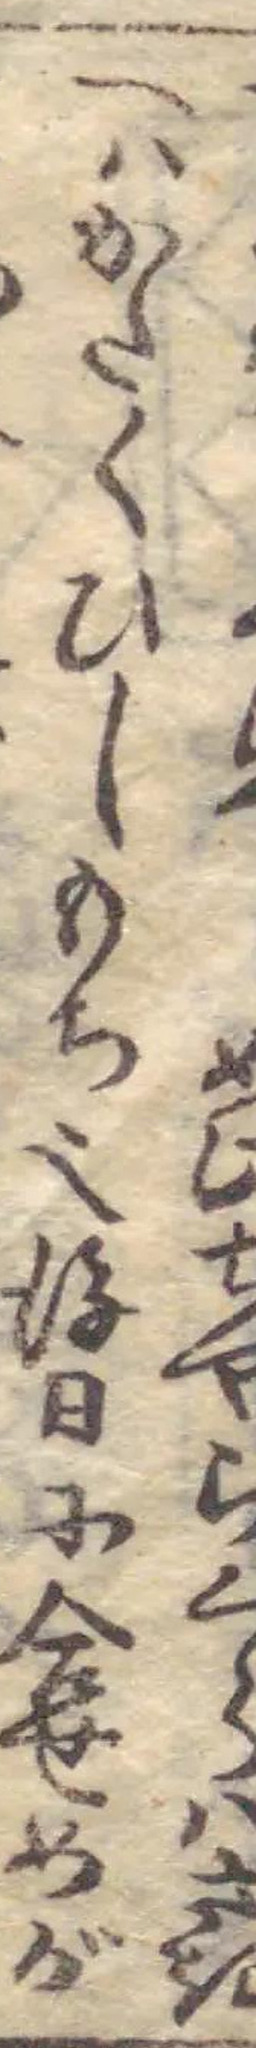へはかたくひしもち也後日に合せめが
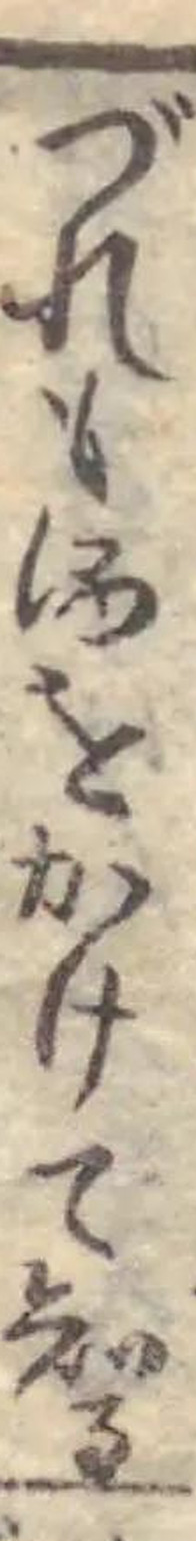づれも酒をかけて知る
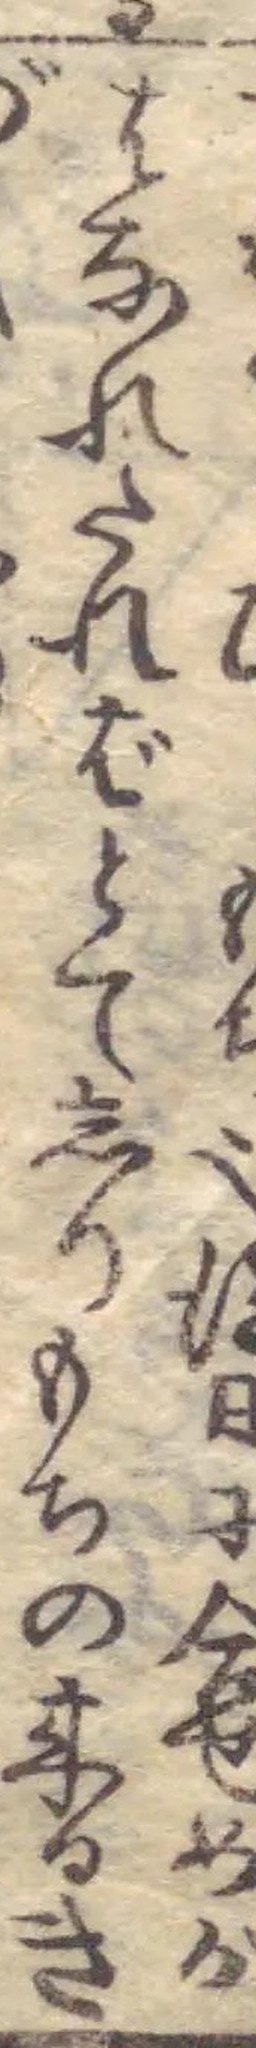はなれたればとてしりもちの来るき
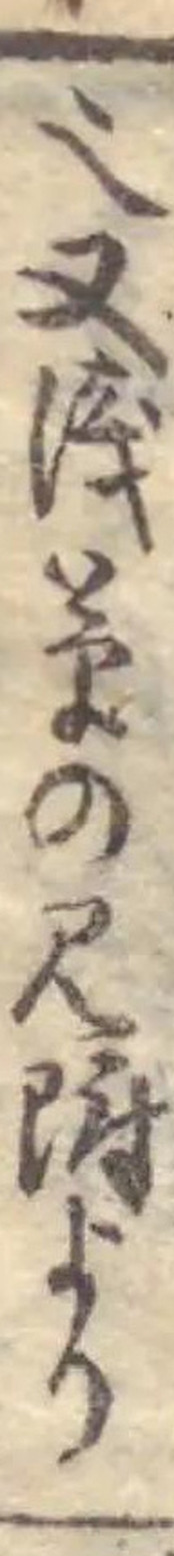也又浅草の尺附より
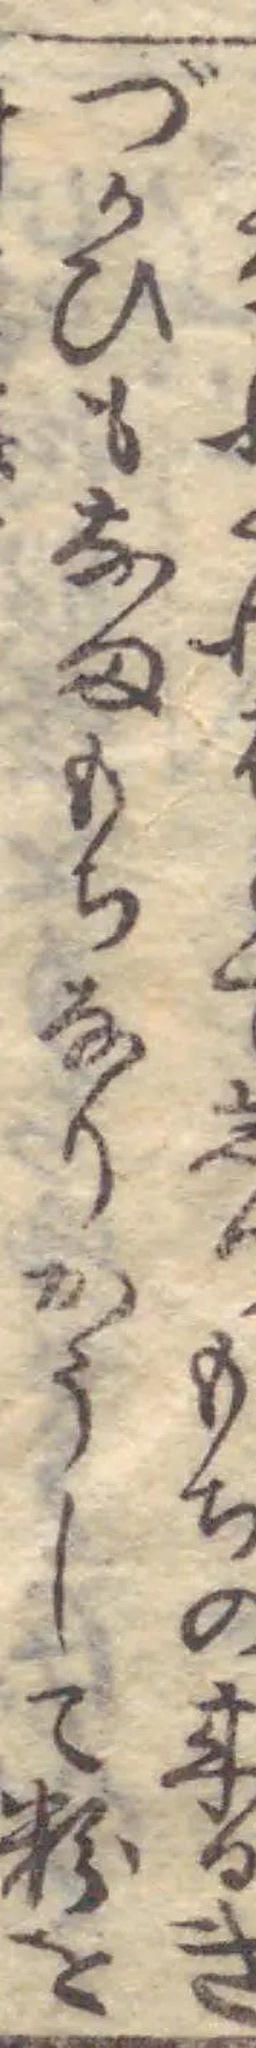づかひもなまもちなりかうして粉を
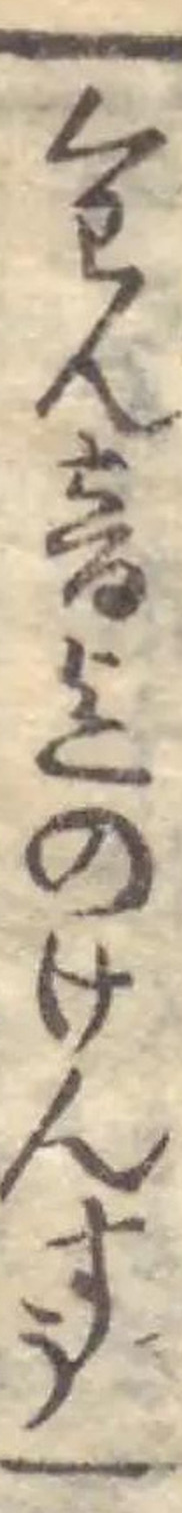くわん音迄のけんすう
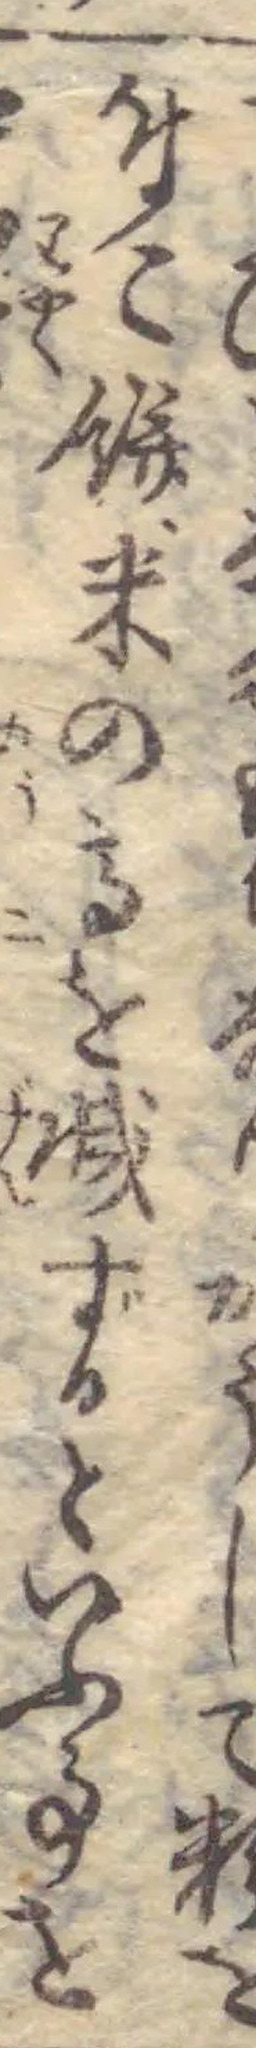付こ？餅米の高を減ずるといふ事を
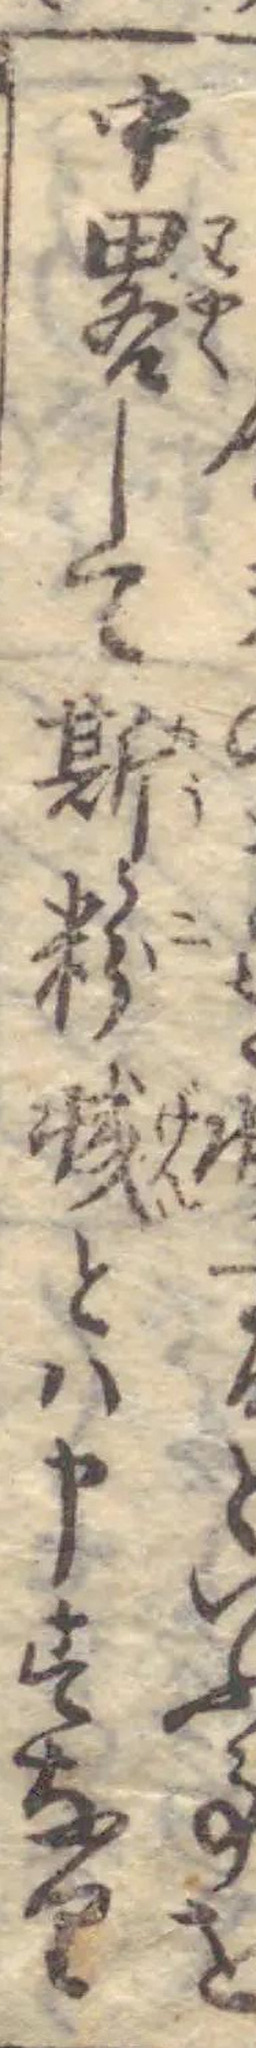中略して斯粉減とは申すなり
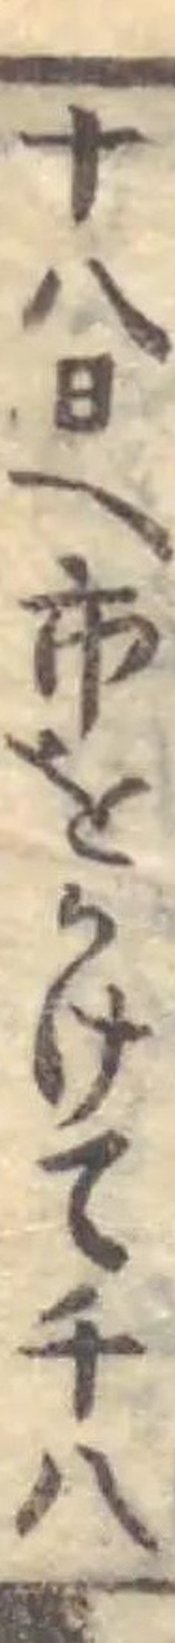十八日へ市をかけて千八
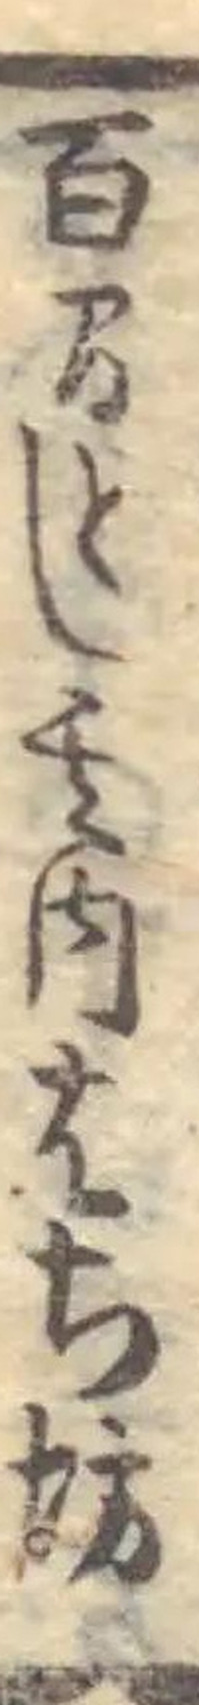百間とし其内はち坊
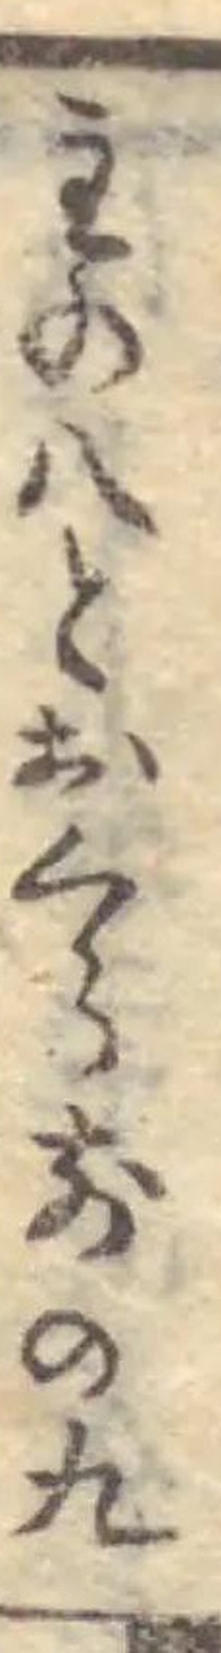主の八とおくら前の九
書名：大通人好記
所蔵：国立国会図書館 National Diet Library, JAPAN
